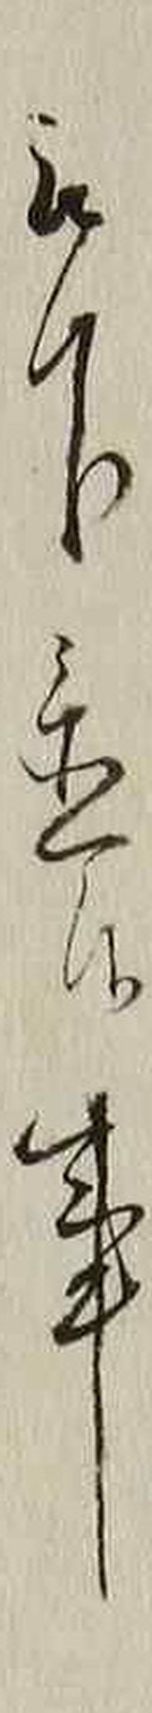被下置候事
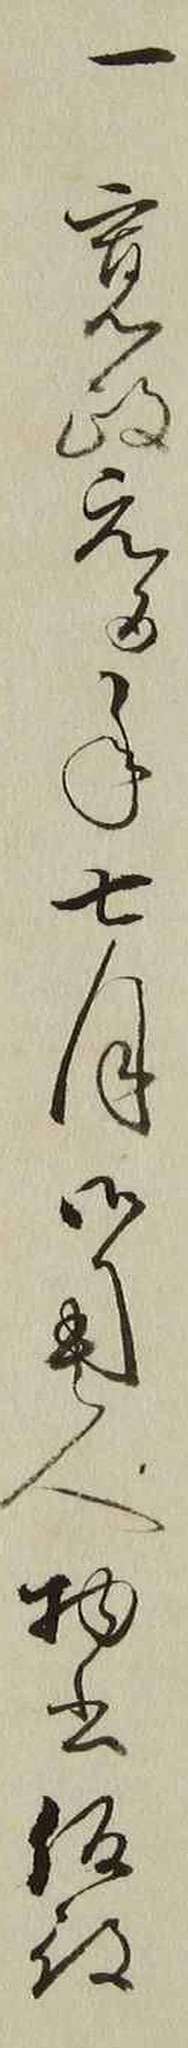一寛政元酉年七月御用人物書仮役
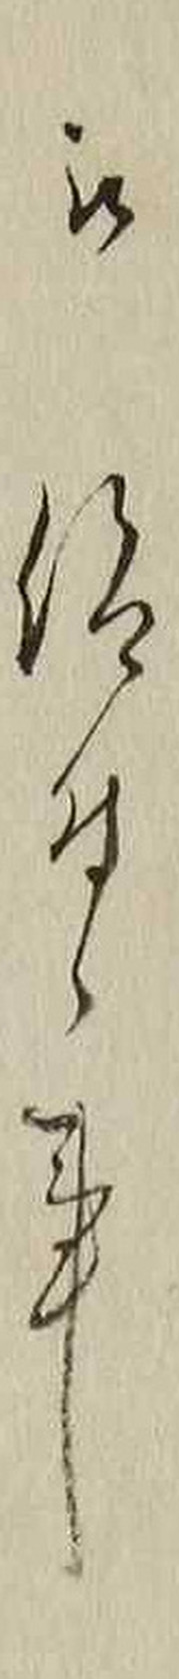被仰付候事
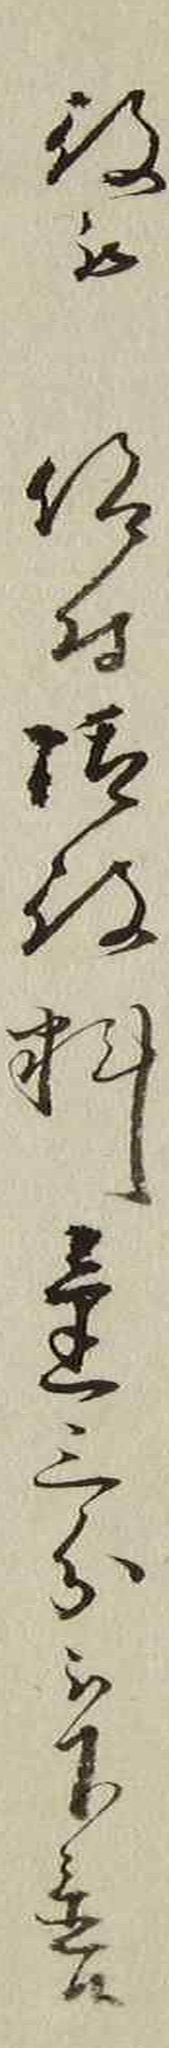役被仰付御役料金三分被下置候
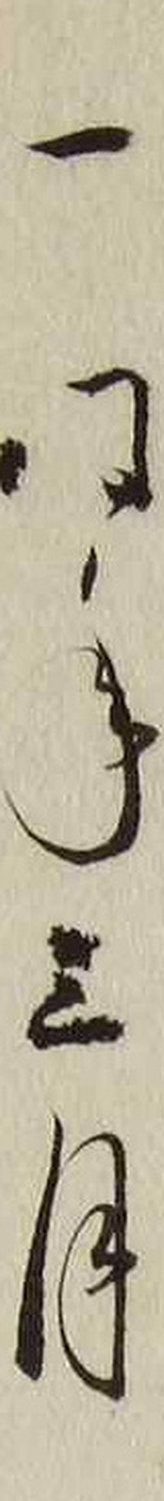一同年三月
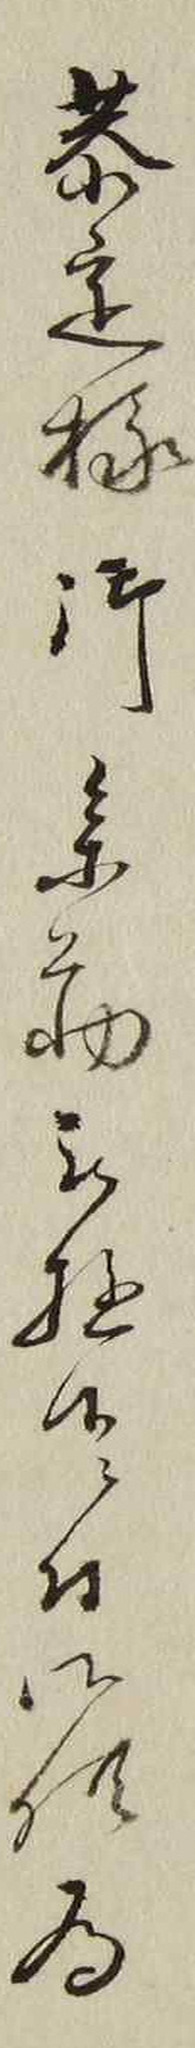恭定様御参勤被遊候ニ付御供為
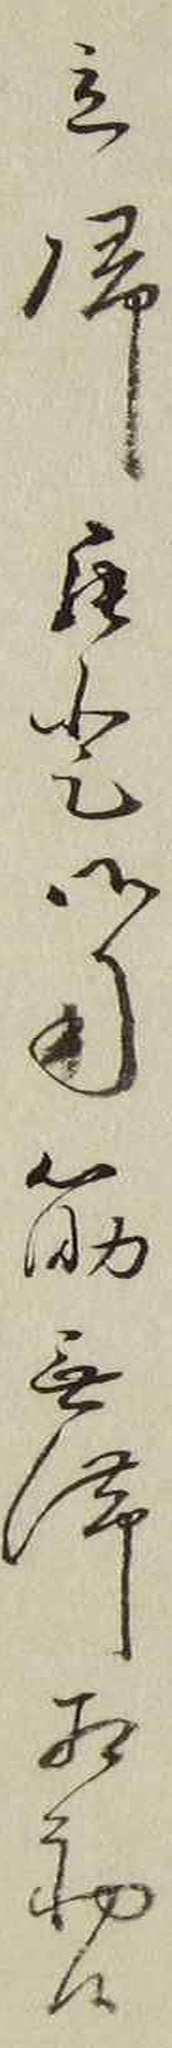立帰罷登御用筋無滞相勤候
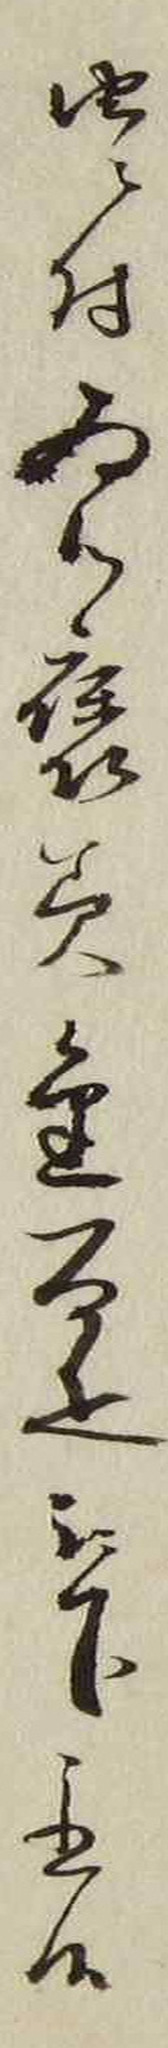由ニ付為御褒美金百疋被下置候
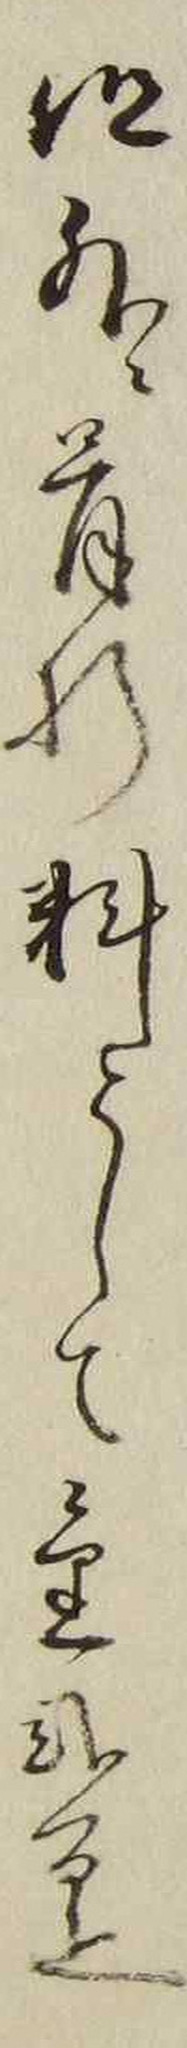但外ニ骨折料として金弐百疋

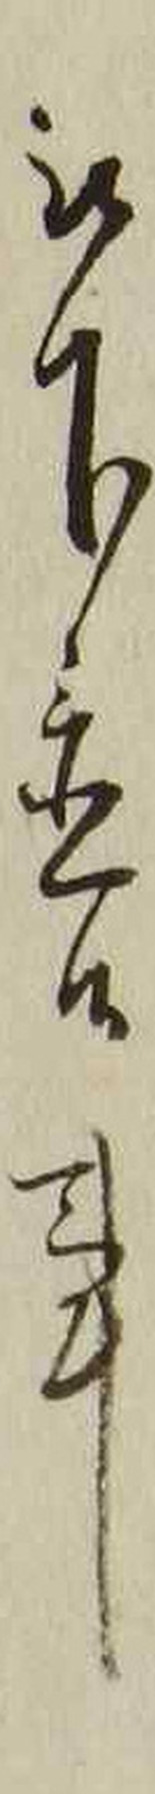被下置候事
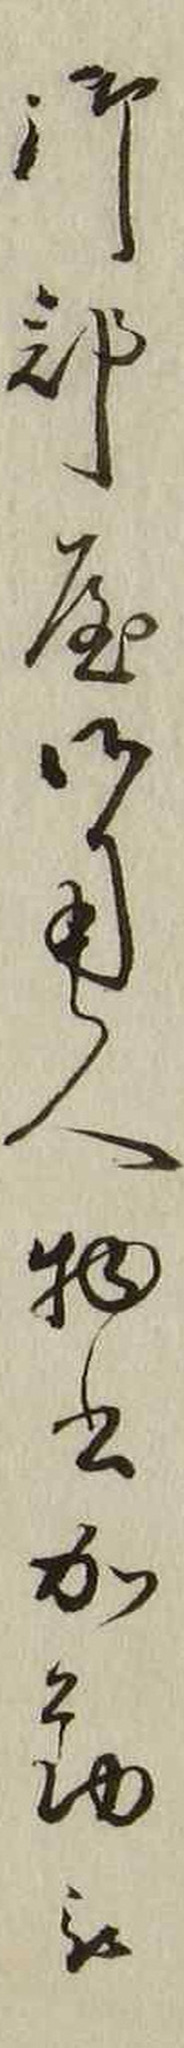御部屋御用人物書加勤被
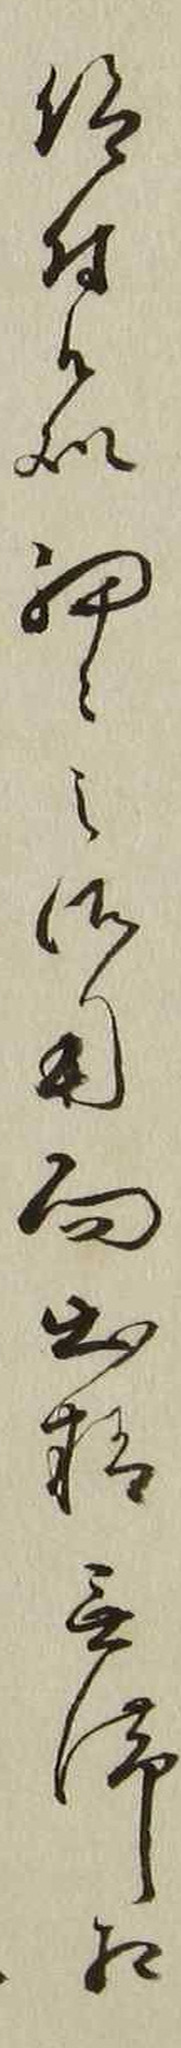仰付候処細々之御用向出精無滞相
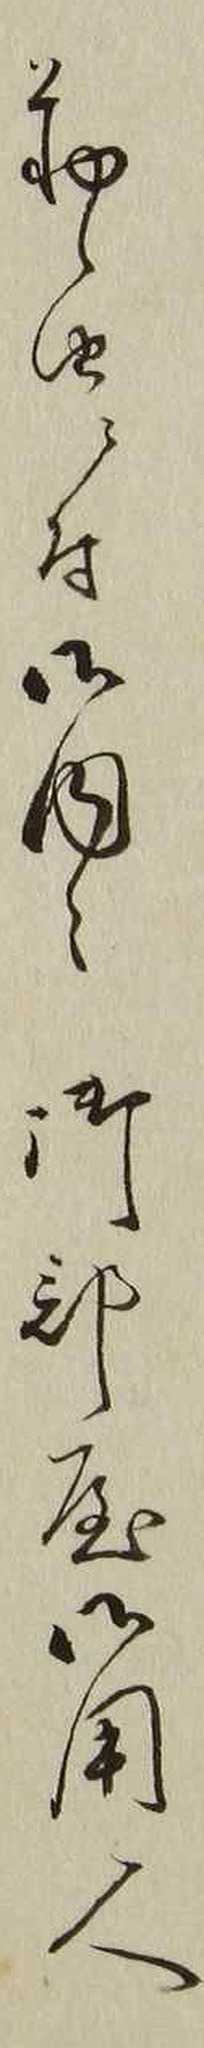勤候由ニ付御内々御部屋御用人
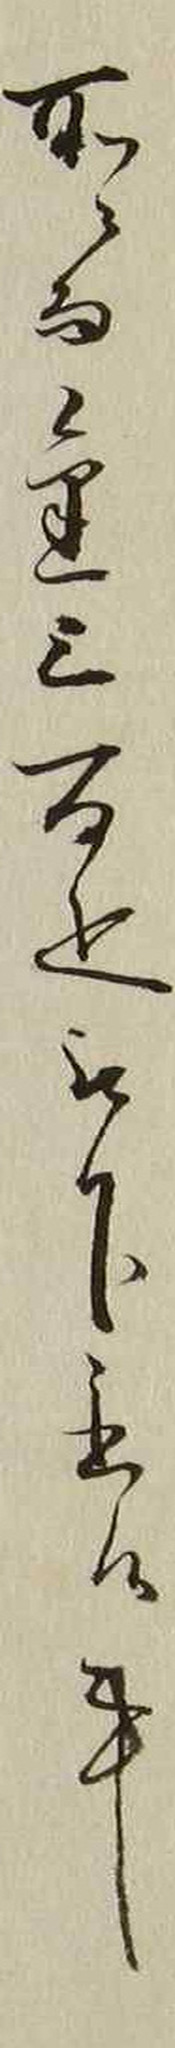所ニ而金三百疋被下置候事
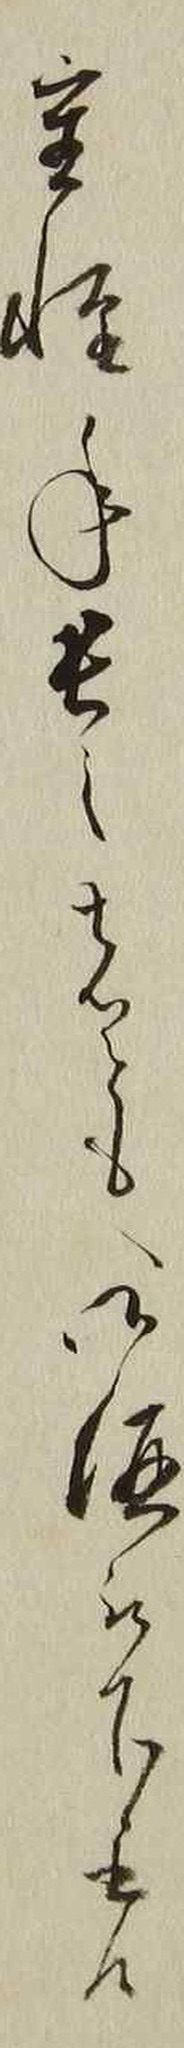重軽年長之者ともへ御酒被下置候
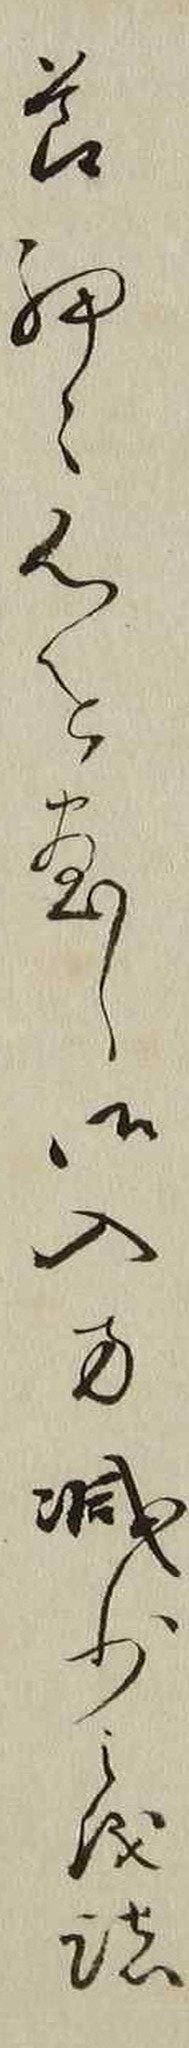節細々心を尽し御入方減少之儀諸
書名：諸士系譜　巻之10　い之部10
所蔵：会津若松市立会津図書館
